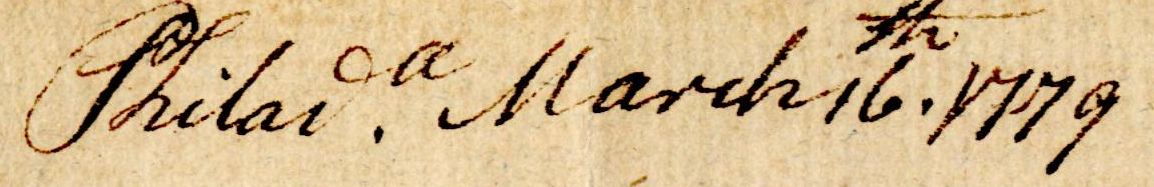Philad^a. March 16^th. 1779
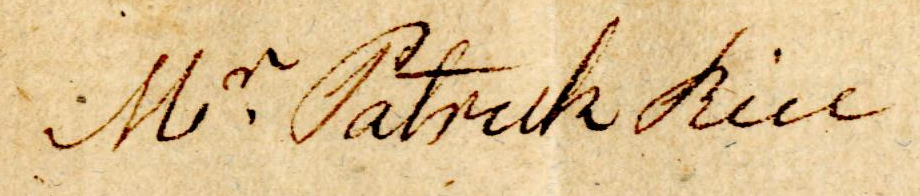M^r Patrick Rice
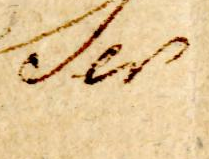Sir
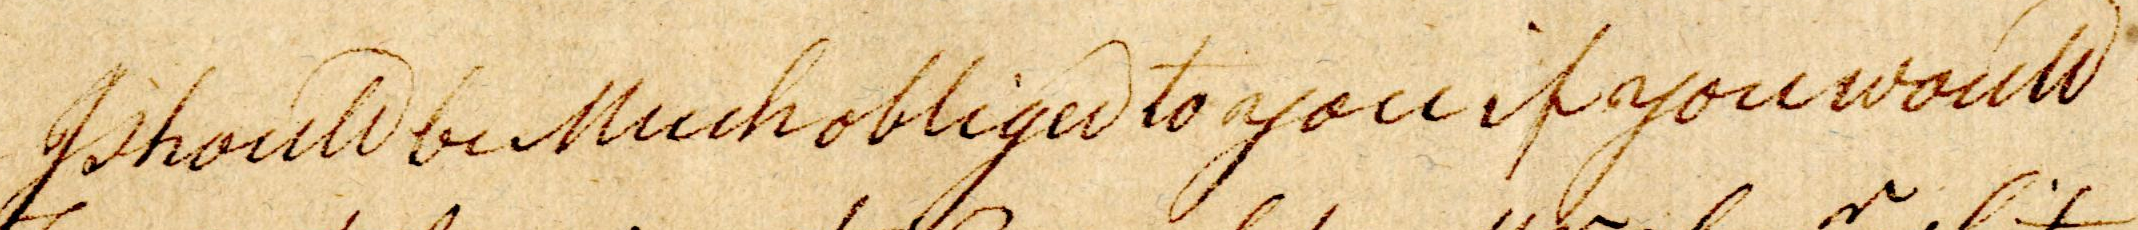I should be much obliged to you if you would
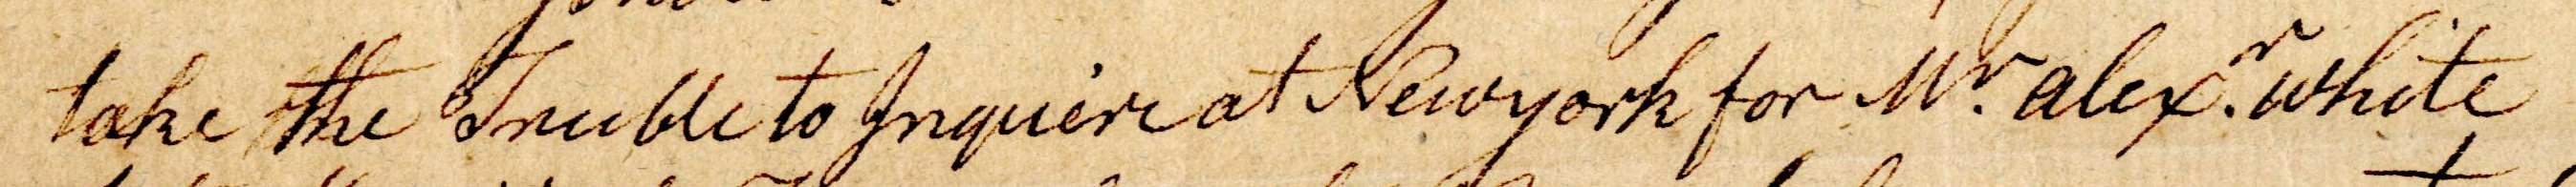take the trouble to inquire at New York for M^r. Alex^r. White
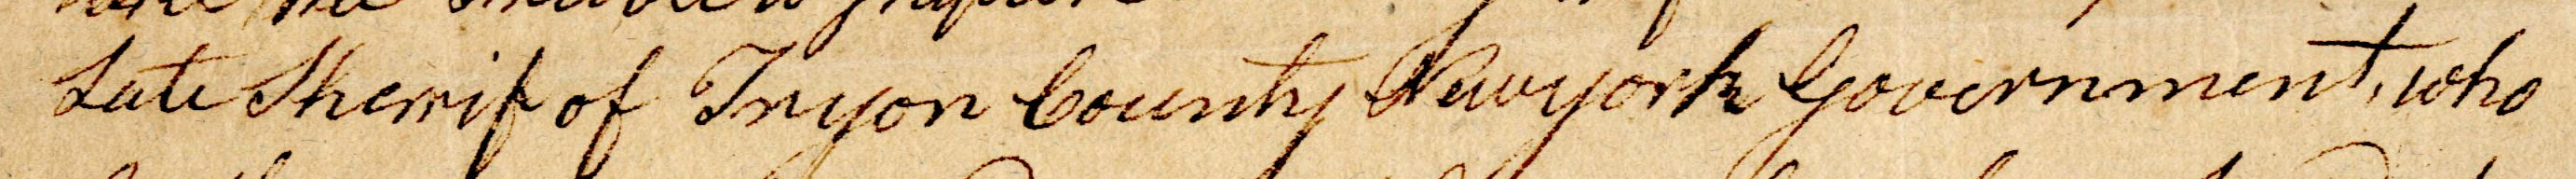Late sherrif of Tryon County New york Government, who
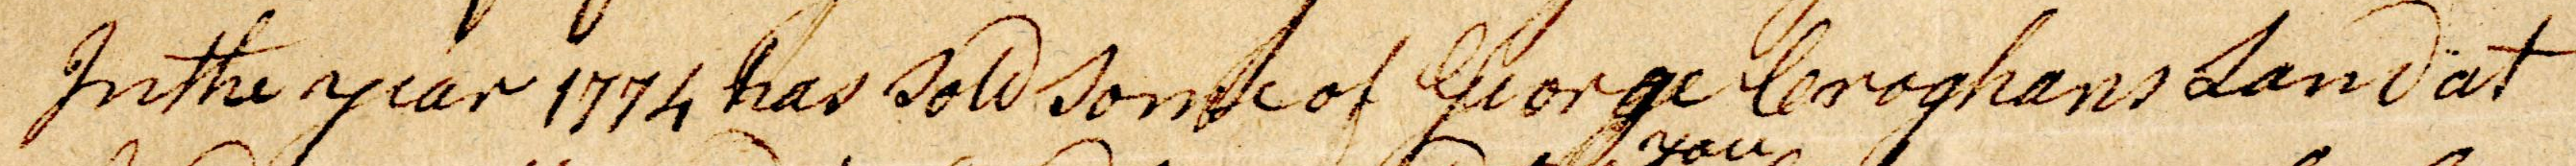In the year 1774 has sold some of George Croghans Land at
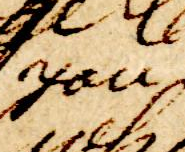you
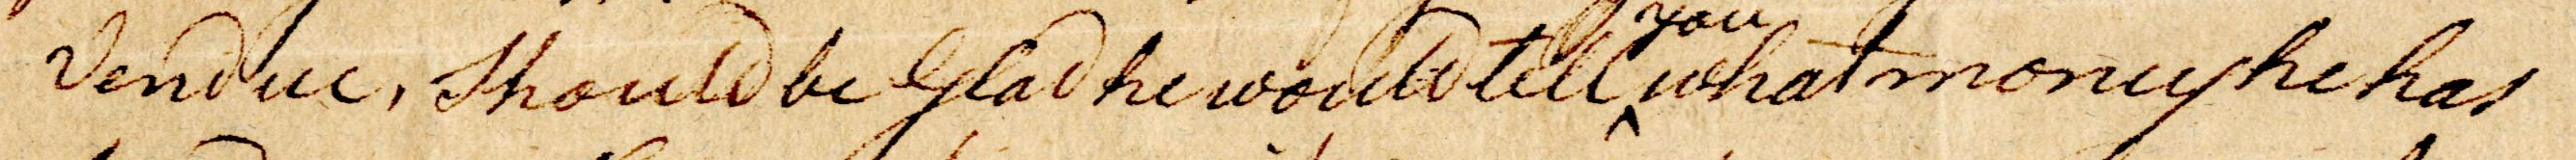vendue, should be glad he would tell ^ what money he has
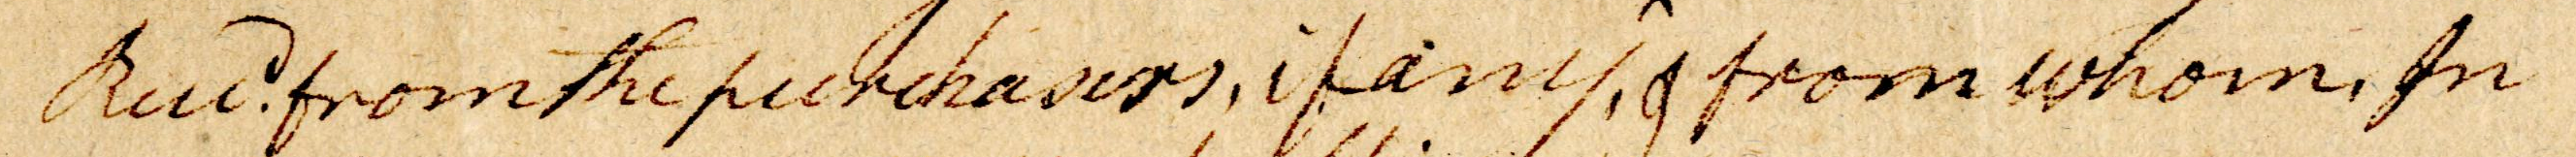rec^d. from the purchase, if any, g from whom. In
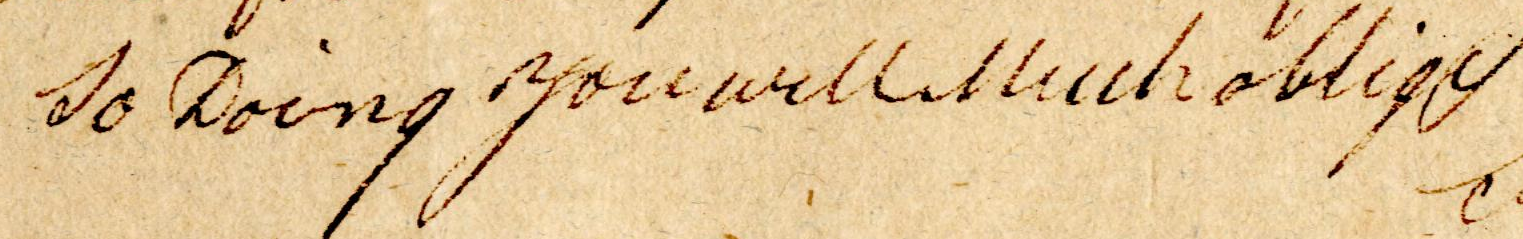so Doing you will Much oblige
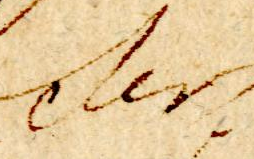Sir
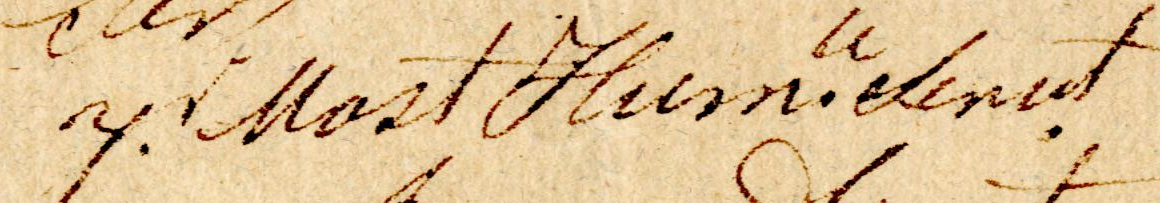y^r. Most Hum^le Serv^t.
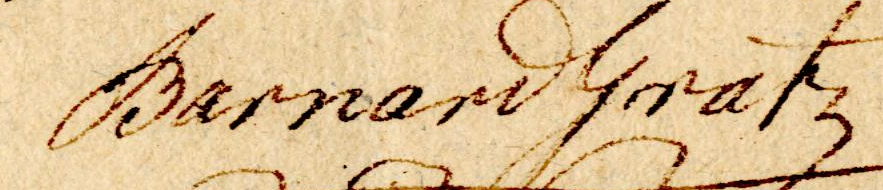Barnard Gratz
